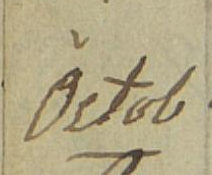Octob
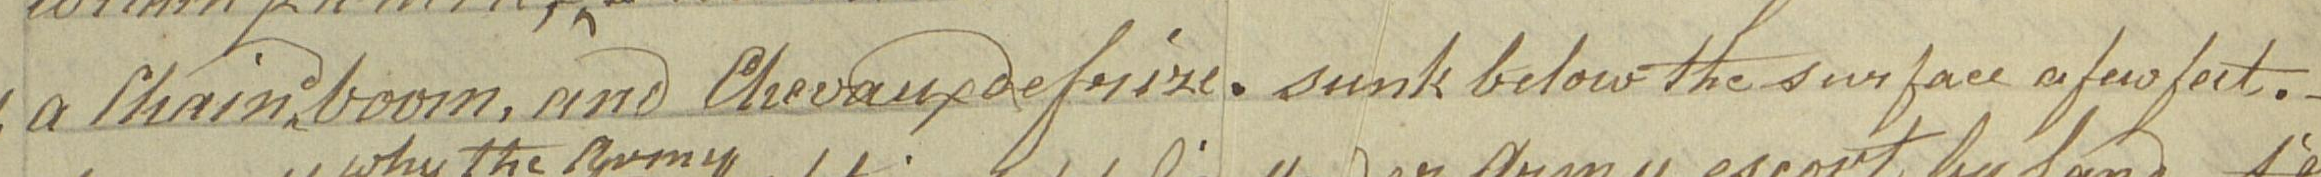a Chain^d boom, and Chevaux de frise. sunk below the surface a few feet.
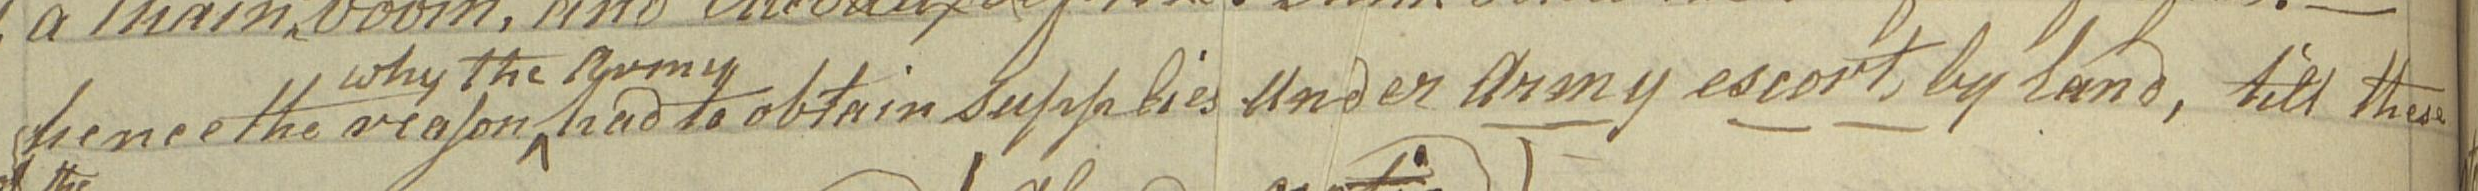hence the reason ^ had to obtain supplies under Army escort by land, till these
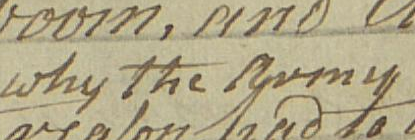why the Army
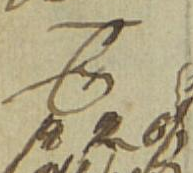6
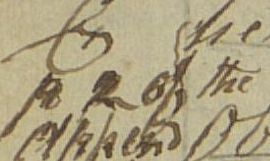p 2 of the
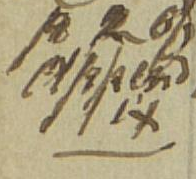Append-
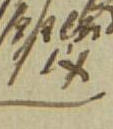-ix
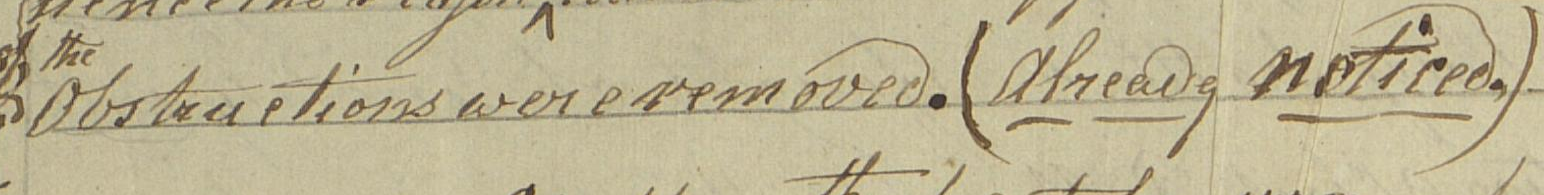Obstructions were removed. (Already noticed,)
